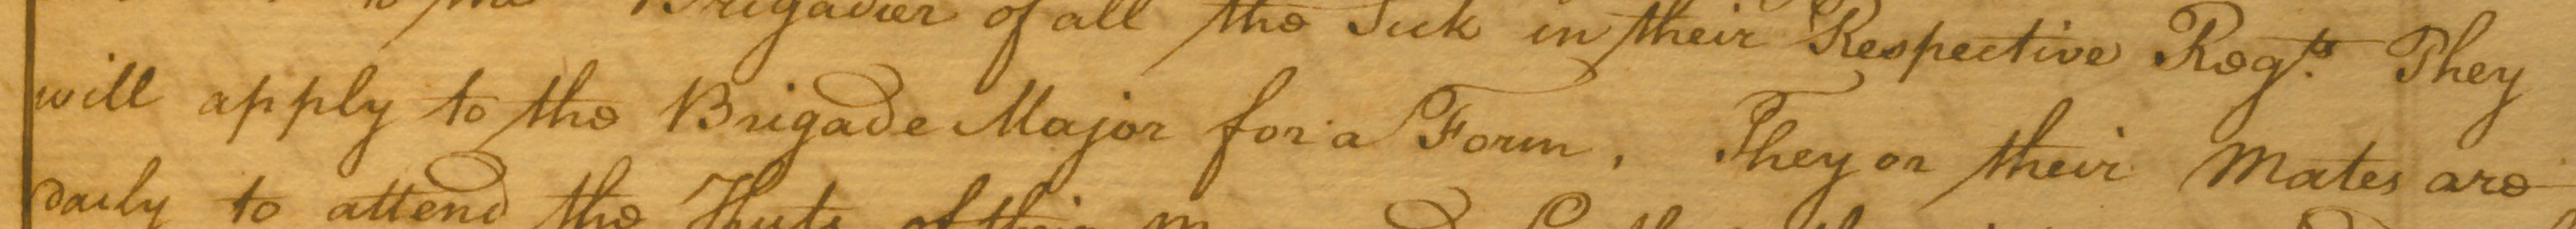will apply to the Brigade Major for a Form. They on their Mates are
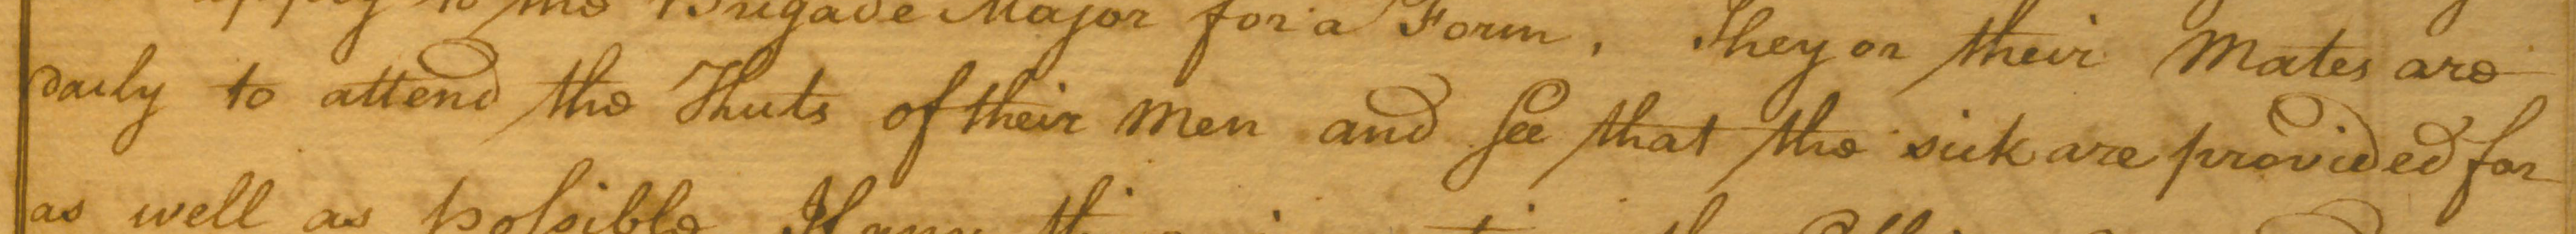duly to attend the Huts of their men and See that the sick are provided for
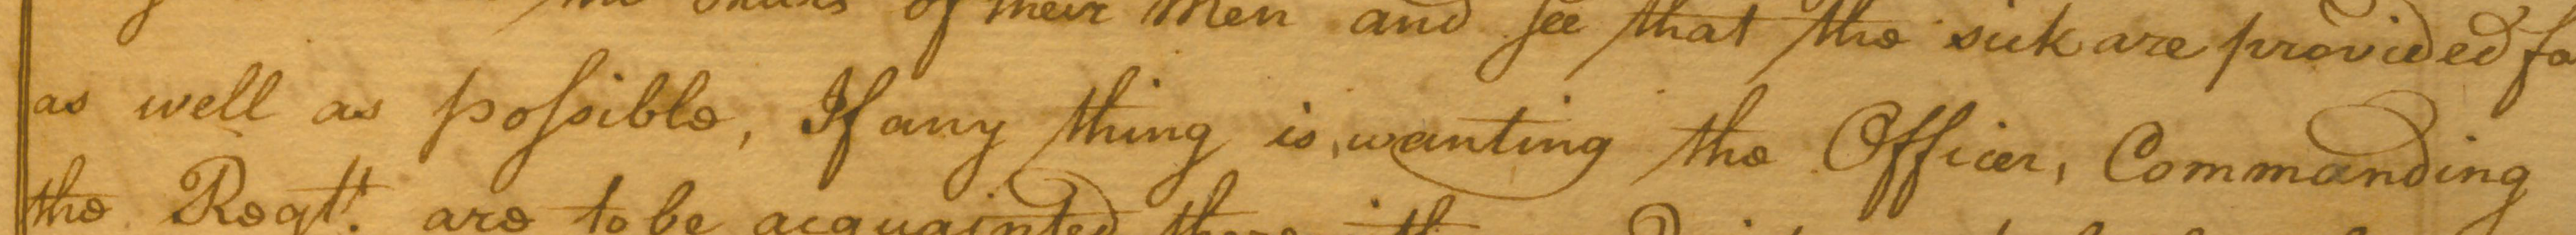as well as possible. If any thing is wanting the Officer, Commanding
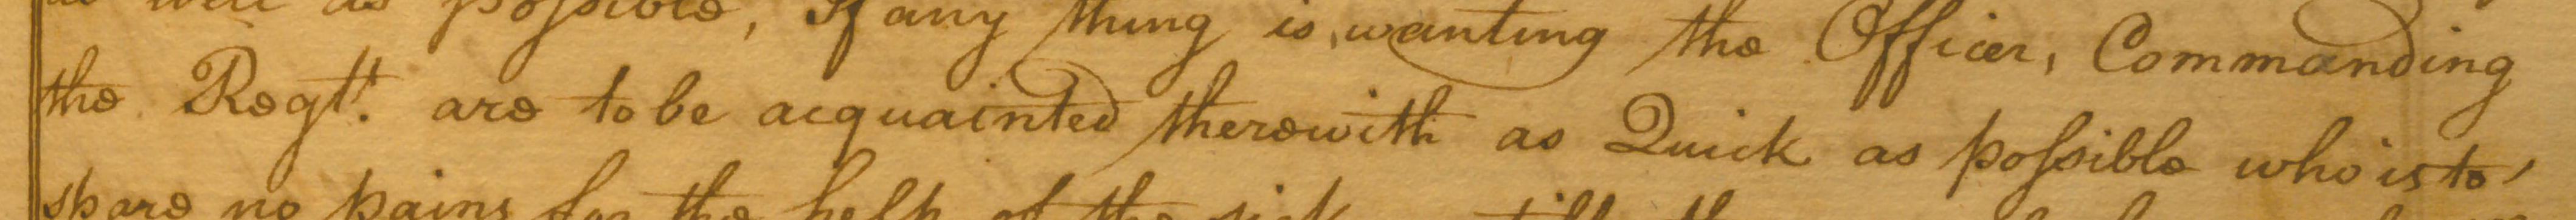the Reg^ts are to be acquainted therewith as Quick as possible who is to
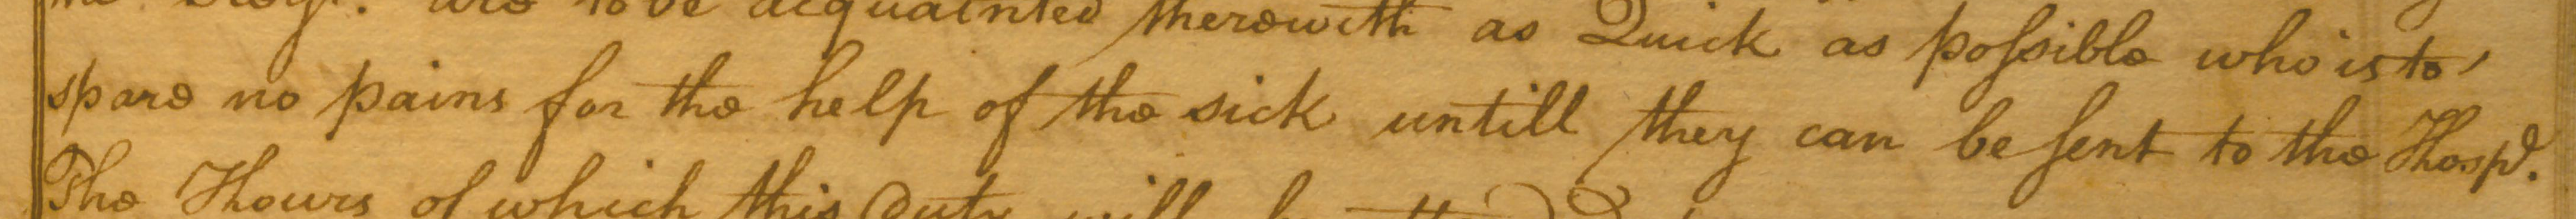spare no pains for the help of the sick untill they can be sent to the Hosp^l.
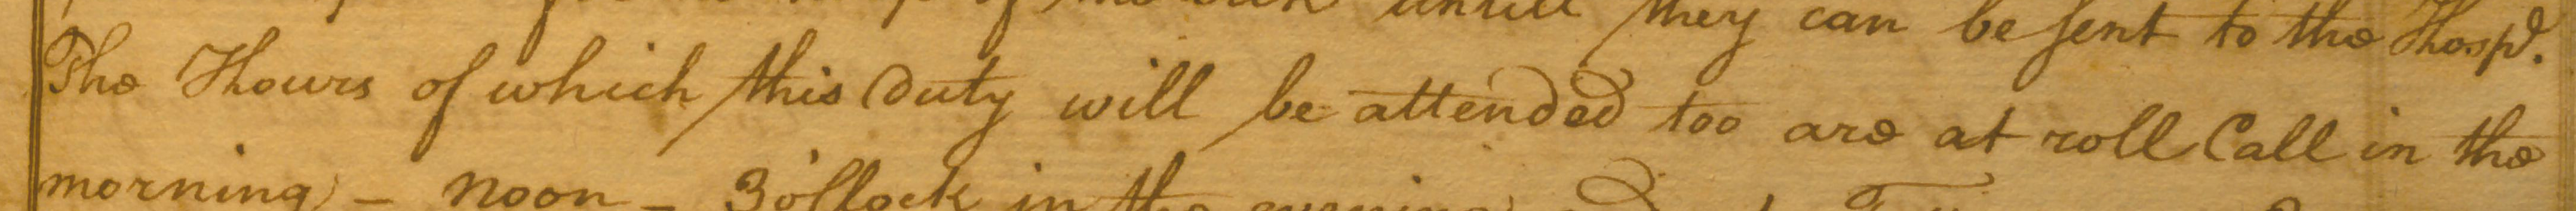The Hours of which this duty will be attended too are at roll Call in the
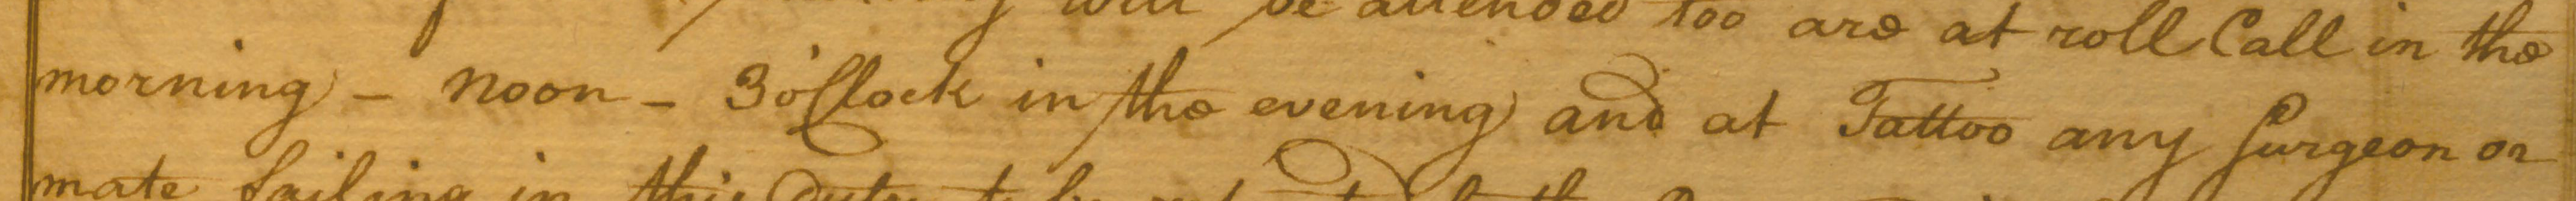morning- noon- 3 o'Clock in the evening and at Tattoo any Surgeon or
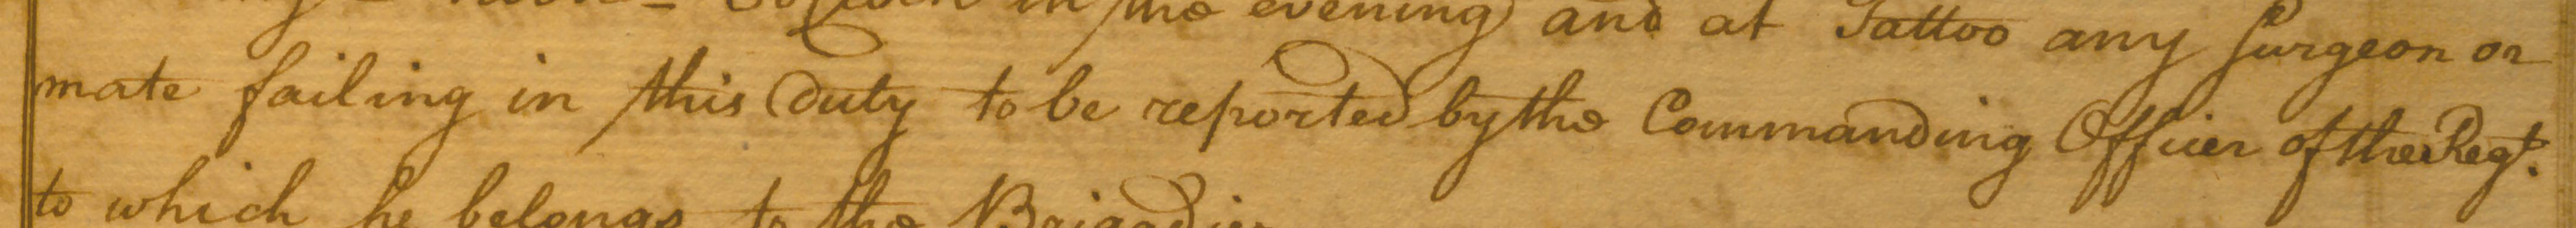mate failing in this duty to be reported by the Commanding Officer of the Reg^t.
